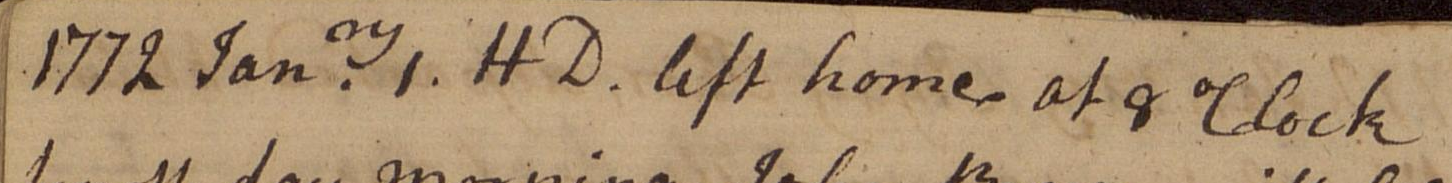1772 Jan^ry. 1. HD. left home at 8 oClock
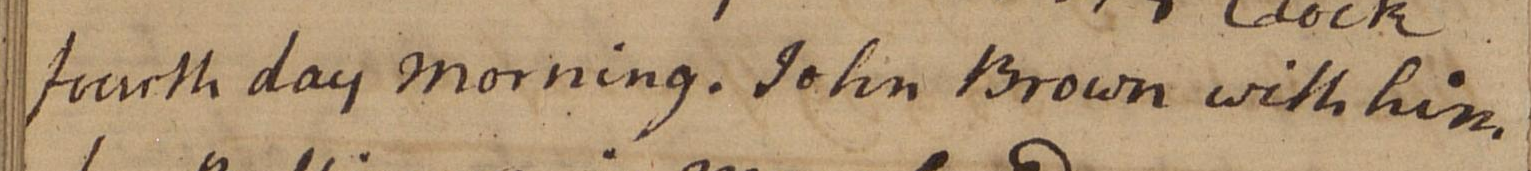fourth day morning. John Brown with him.
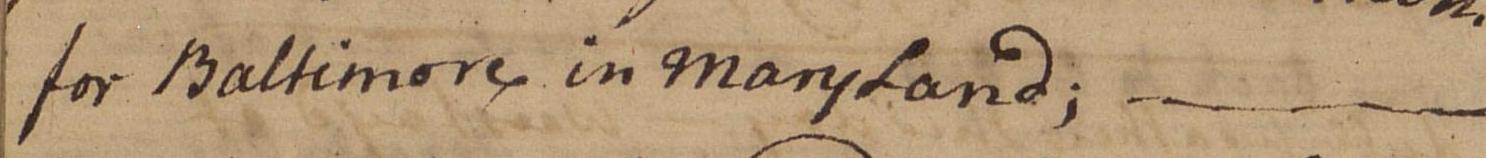for Baltimore in Maryland;-
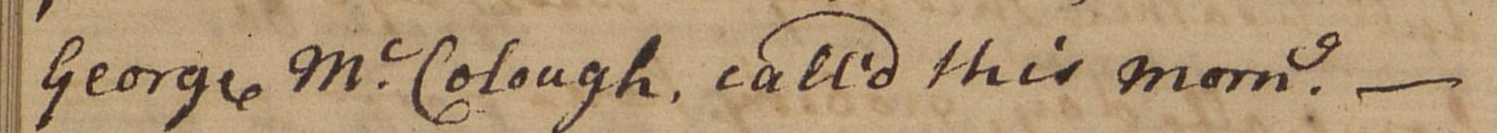George M^c. Colough, call'd this morn^g.-
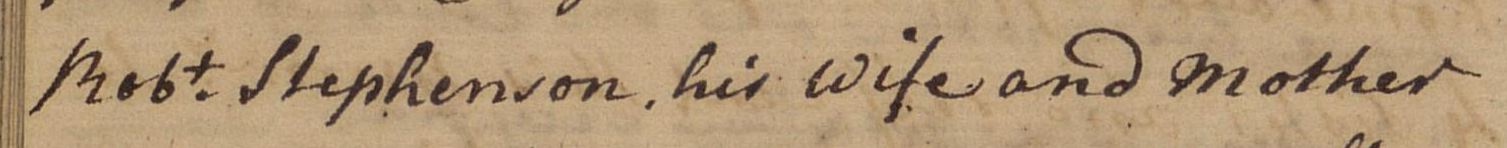Rob^t. Stephenson, his wife and mother
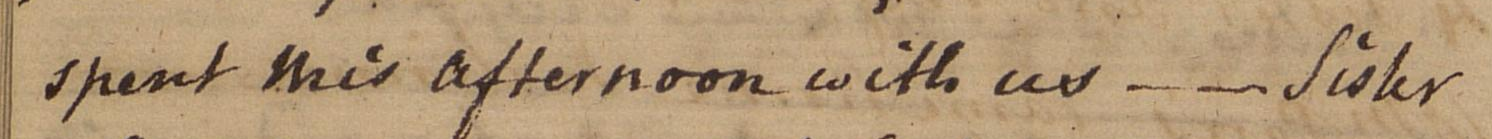spent mis afternoon with us-- Sister
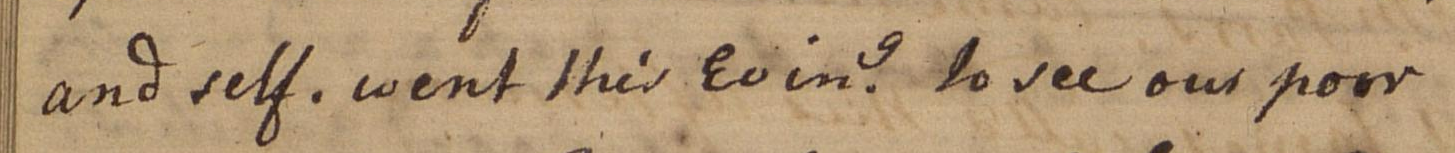and self. went this Even^g to see our poor
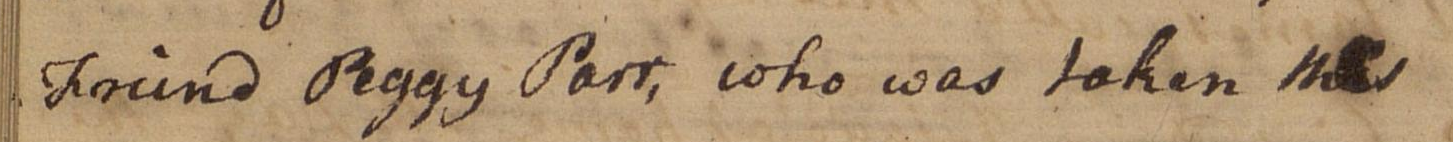Friend Peggy Part, who was taken this
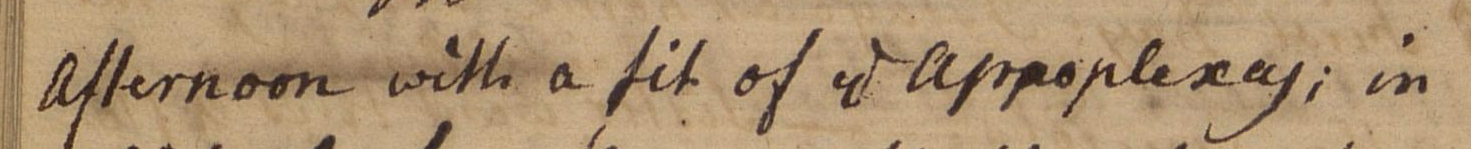Afternoon with a fit of y^e Appoplexy; in
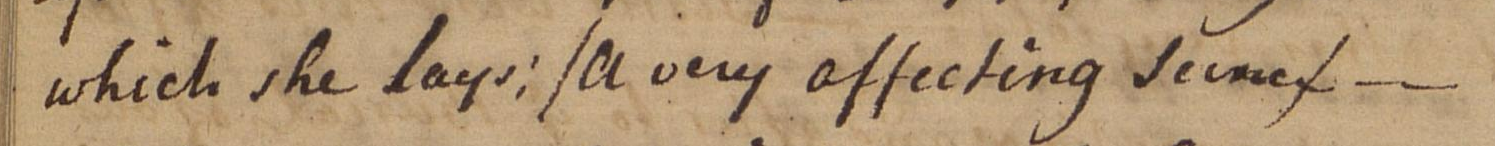which she lays; (al very affecting scene)-
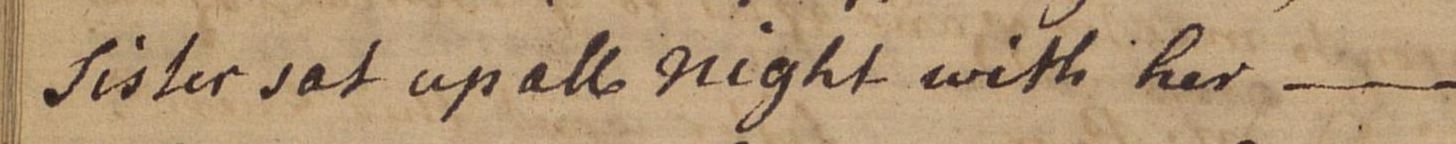Sister sat up all night with her-
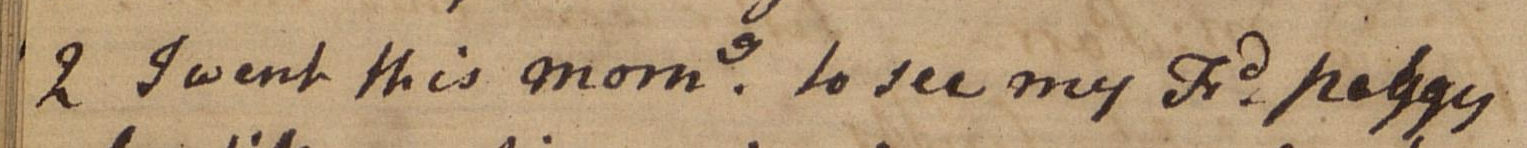2 I went this morn^g. to see my F^d. Peggy
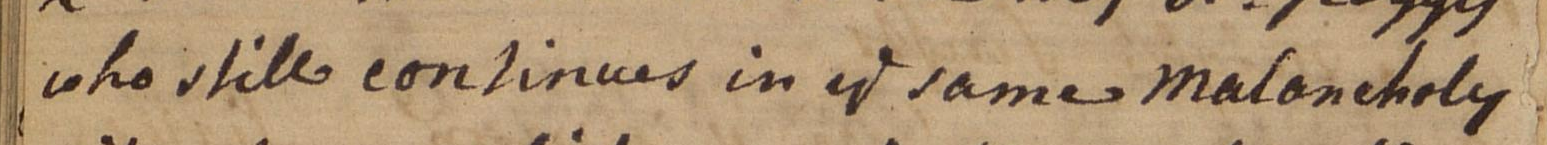who stills continues in y^e same malancholy
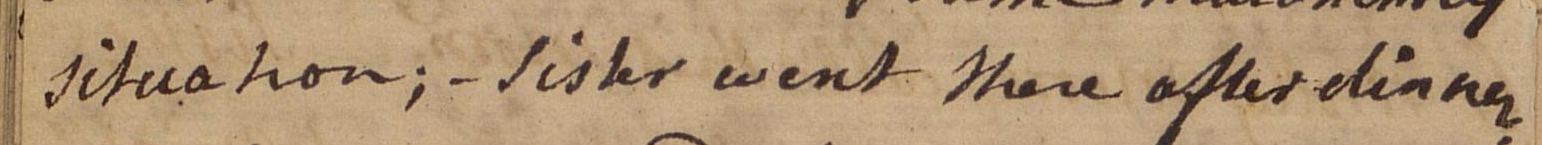situation;- Sister went there after dinner
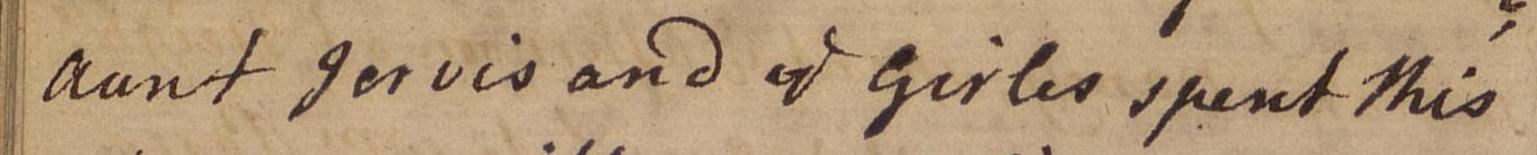Aunt Jervis and y^e Girles spent this
